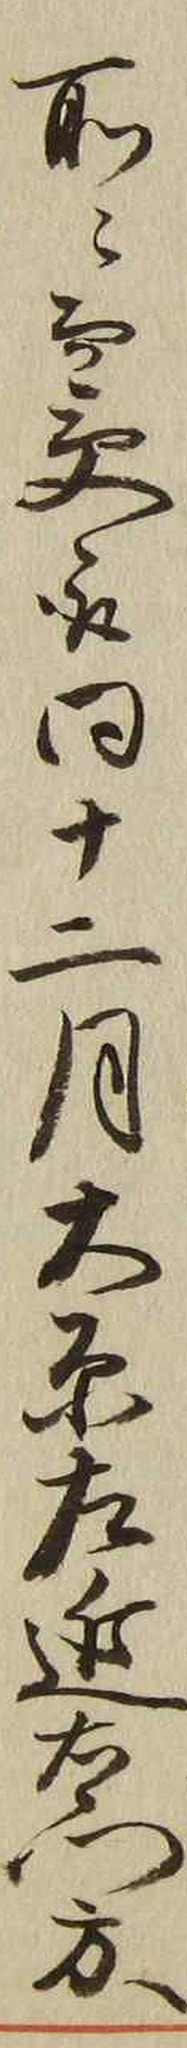所ニ而受取同十二月大原左近右衛門方へ
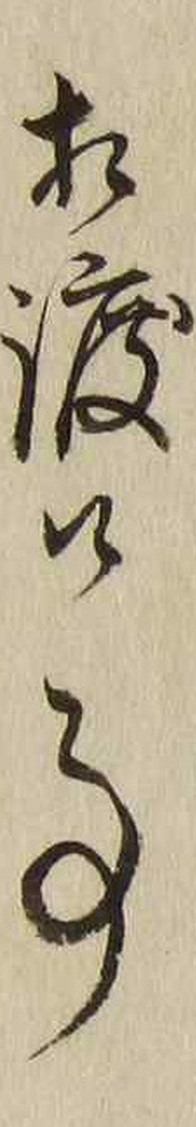相渡候事
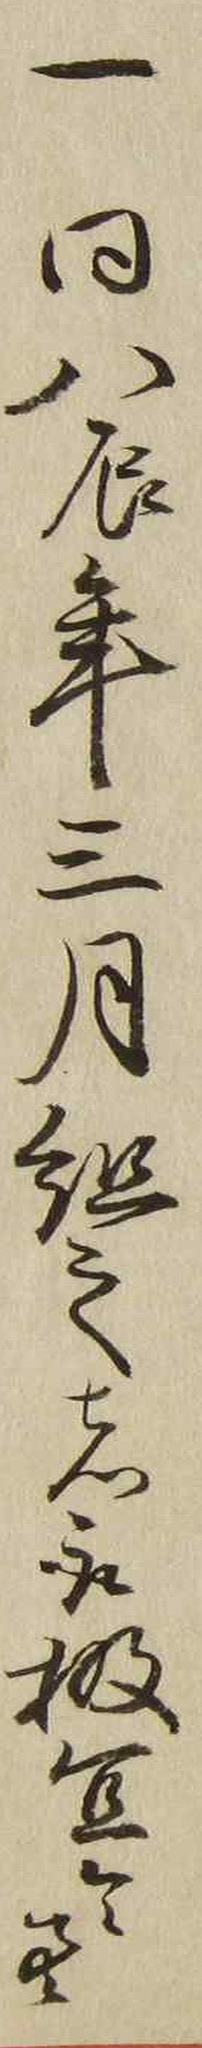一同八辰年三月組之者取扱宜令事

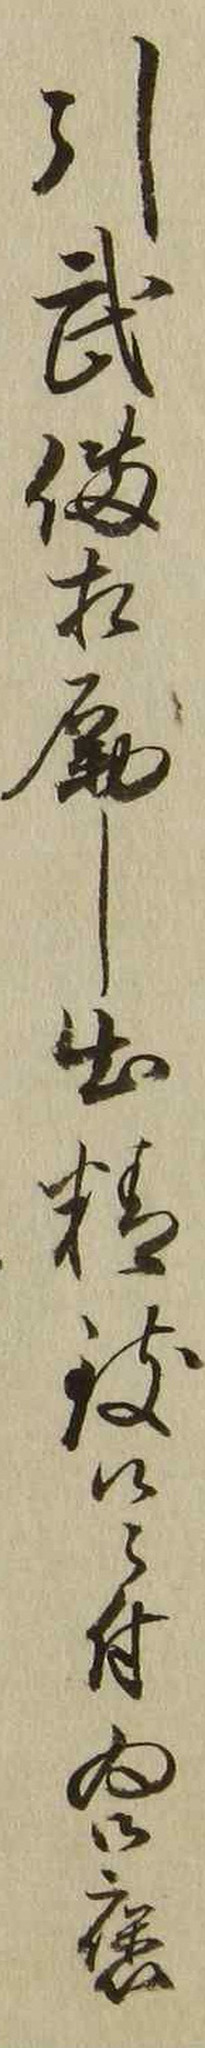引武備相励し出精致候ニ付為御褒
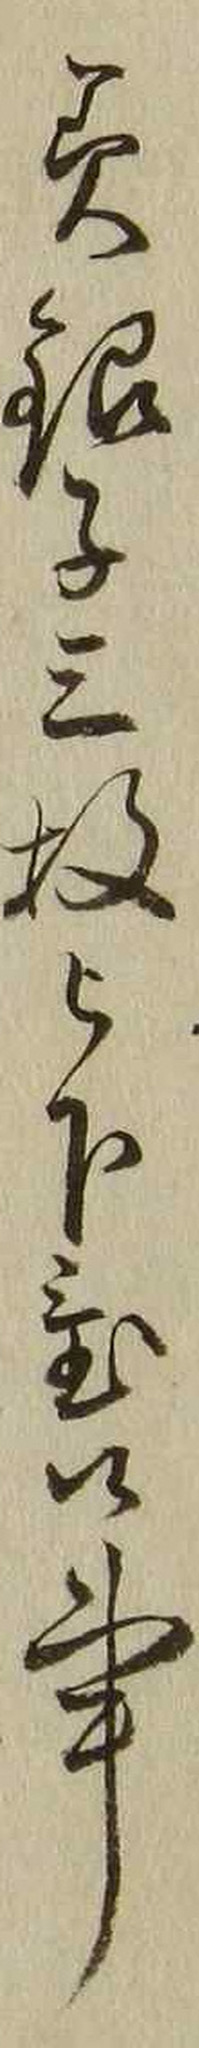美銀子三枚被下置候事
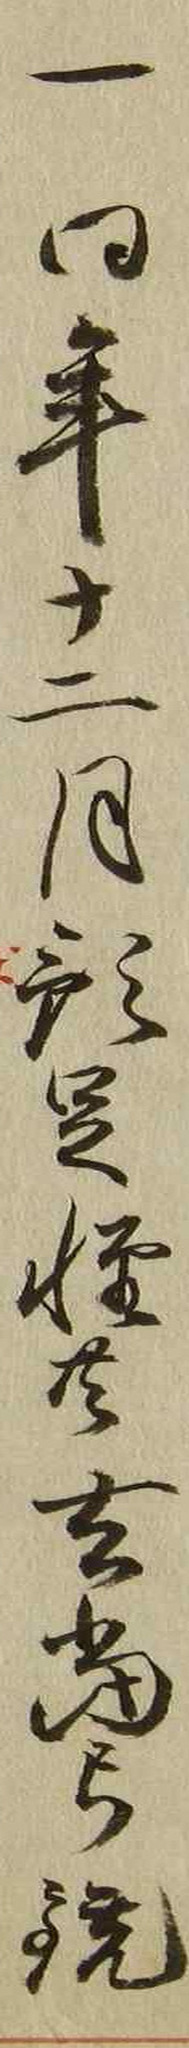一同年十二月預足軽共去当弓銃
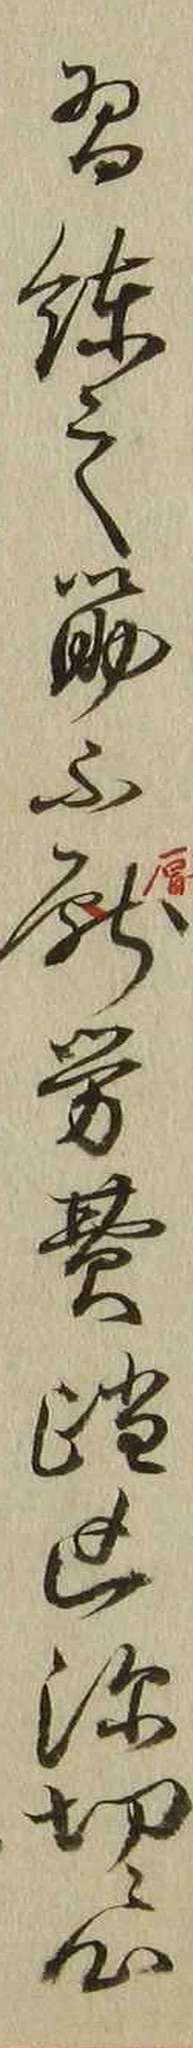習練之筋不厭労費踏込深切ニ心
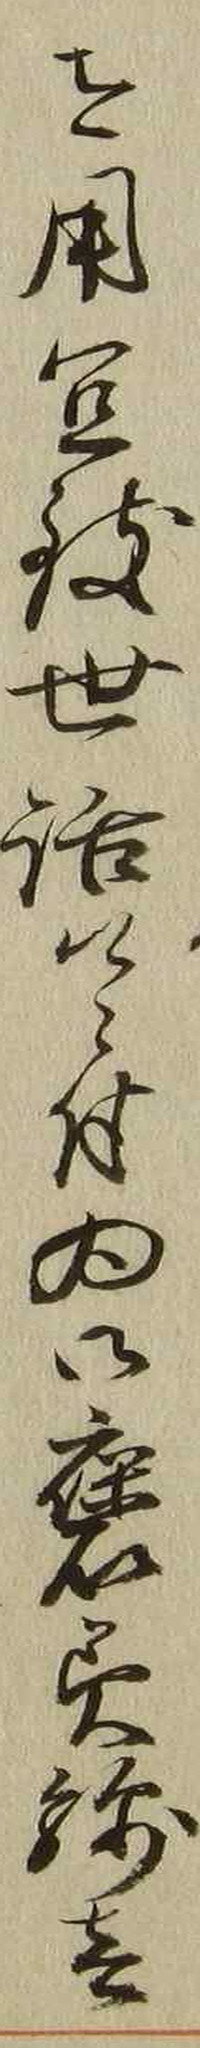を用宜致世話候ニ付為御褒美綿壱
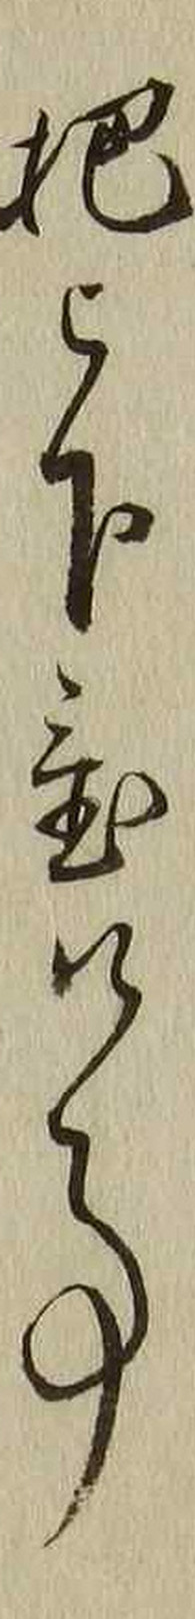把被下置候事
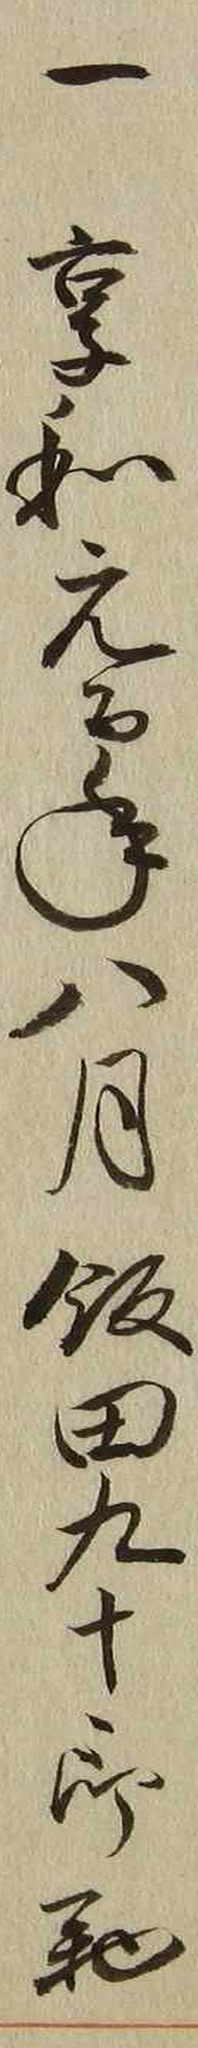一享和元酉年八月飯田九十郎勤
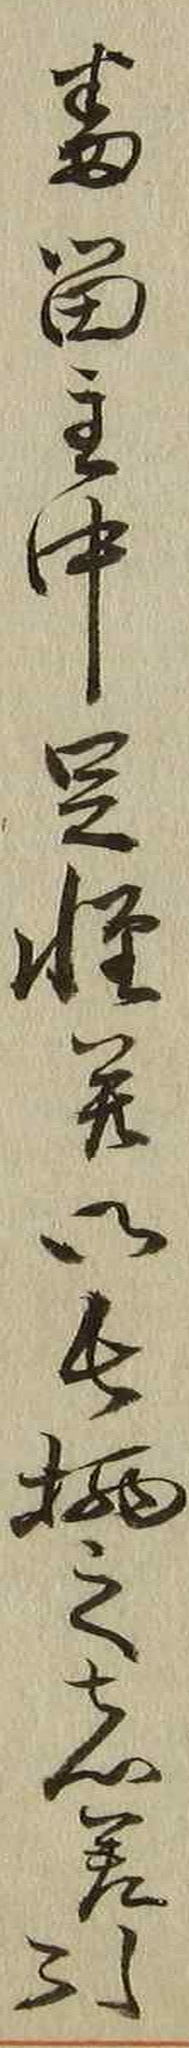番留主中足軽并御長柄之者差引
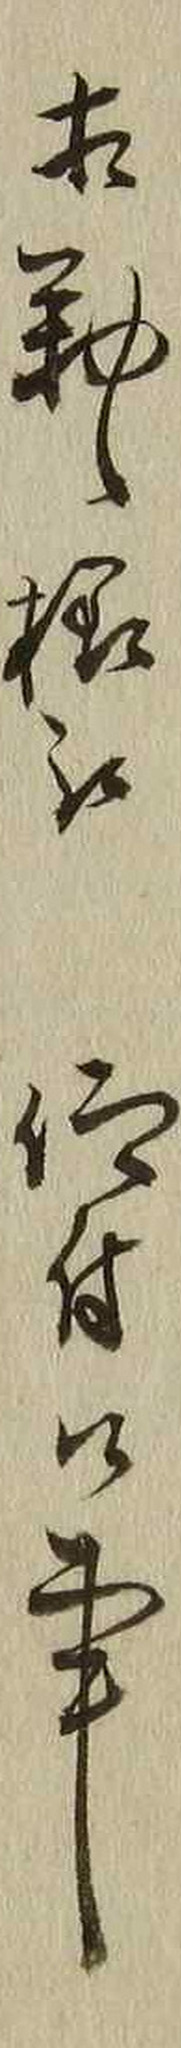相勤候様被仰付候事
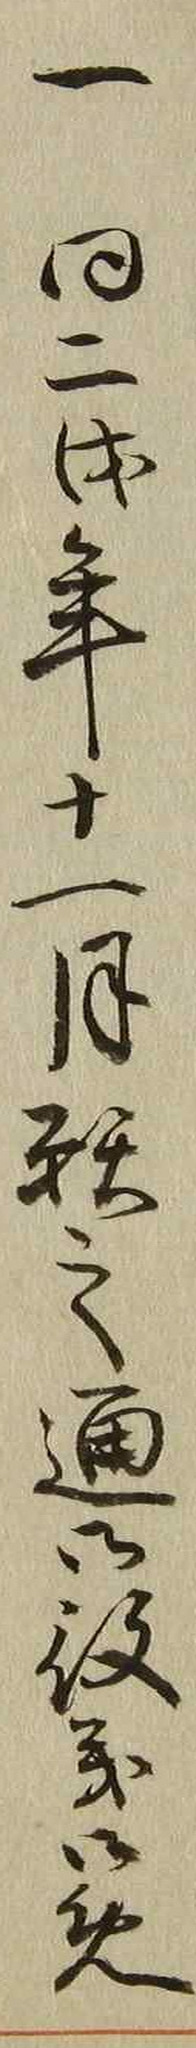一同二戌年十一月願之通御役義御免
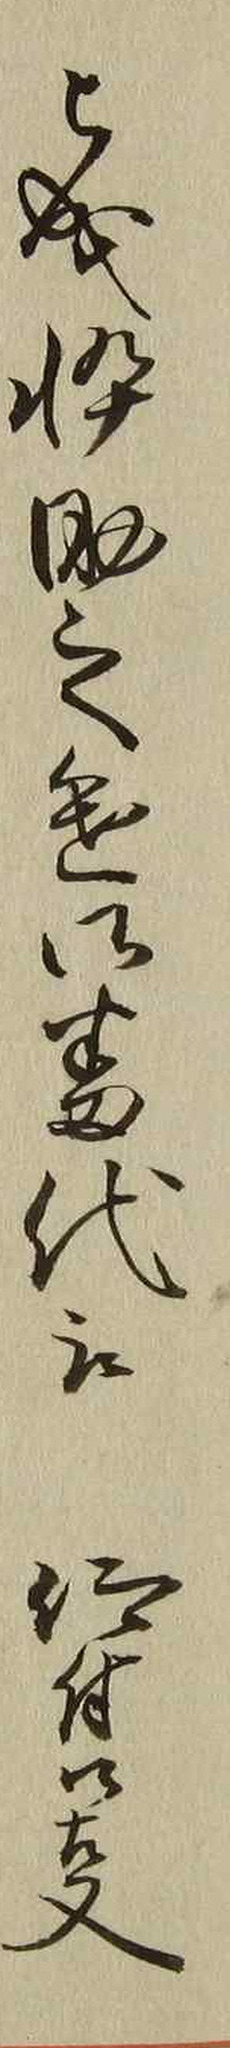被成忰助之進御番代被仰付候事
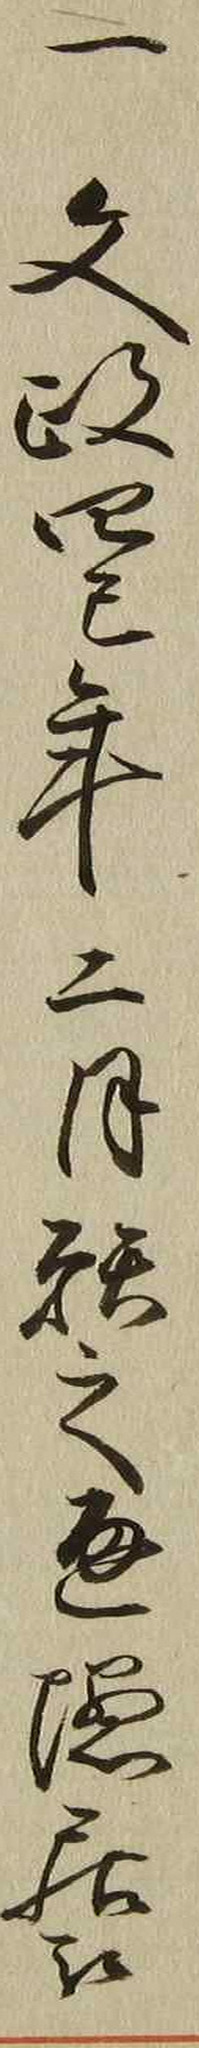一文政四巳年二月願之通隠居被
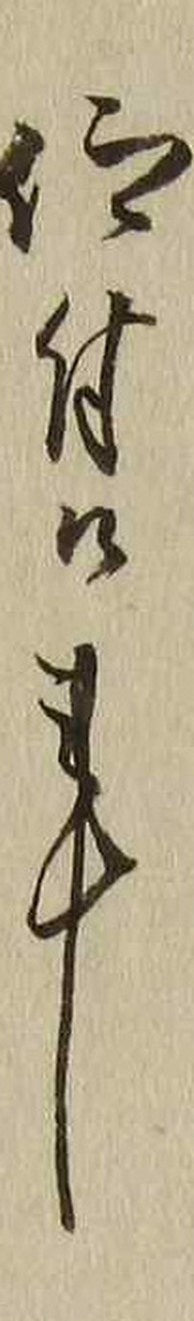仰付候事
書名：諸士系譜　巻之60　と之部3
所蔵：会津若松市立会津図書館
